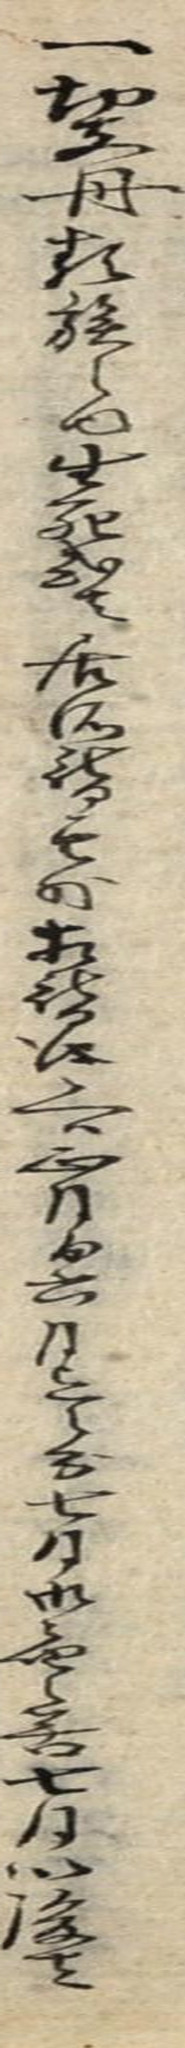一切支丹類族之内生死或は居所替其外相替儀候へは正月ゟ六月迄之分七月御届之筈七月以後は
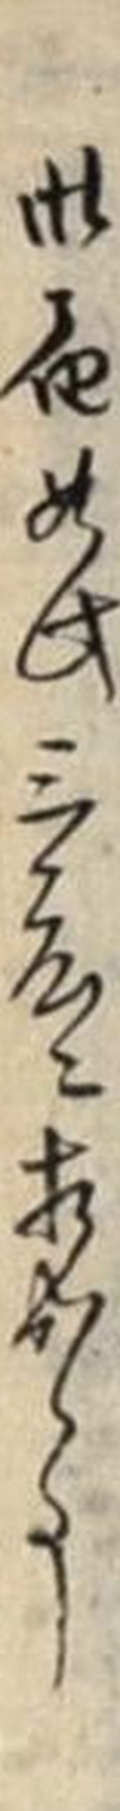御届如此三度に相成候事
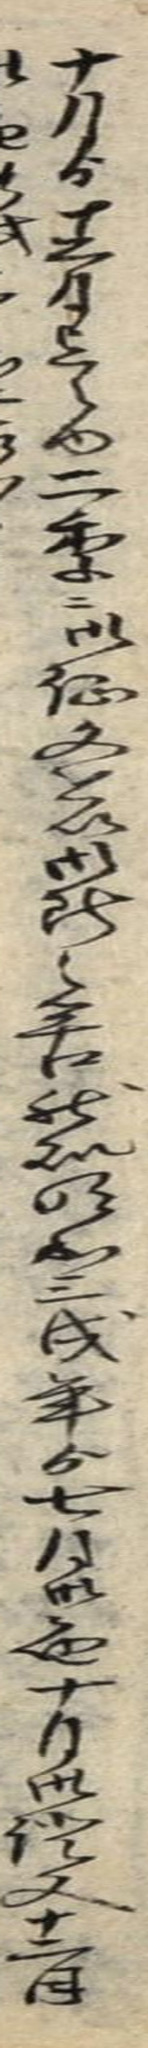十月ゟ十二月迄之内二季に御証文を以御断之筈然処明和三戌年ゟ七月御届十月御証文十二月

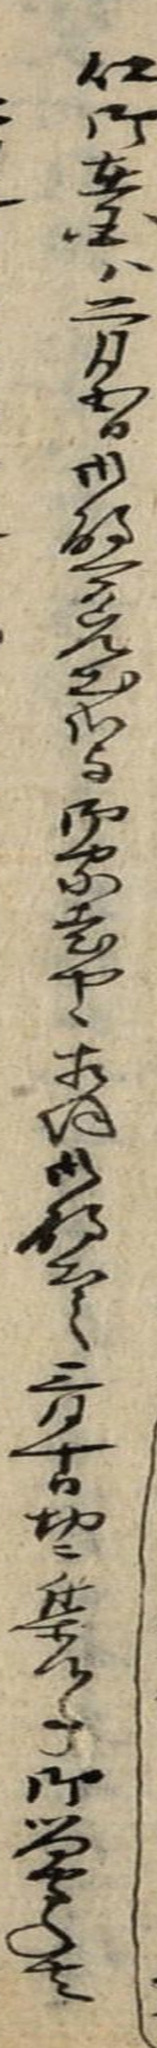仕御在国は二月五日御触可差出哉と御家老中へ相伺御触出之三月十日切に集候事御留守年は
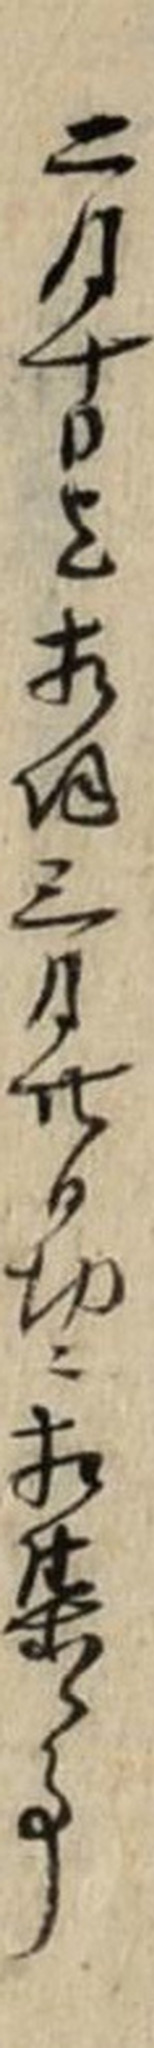二月十日迄相伺三月廿日切に相集候事
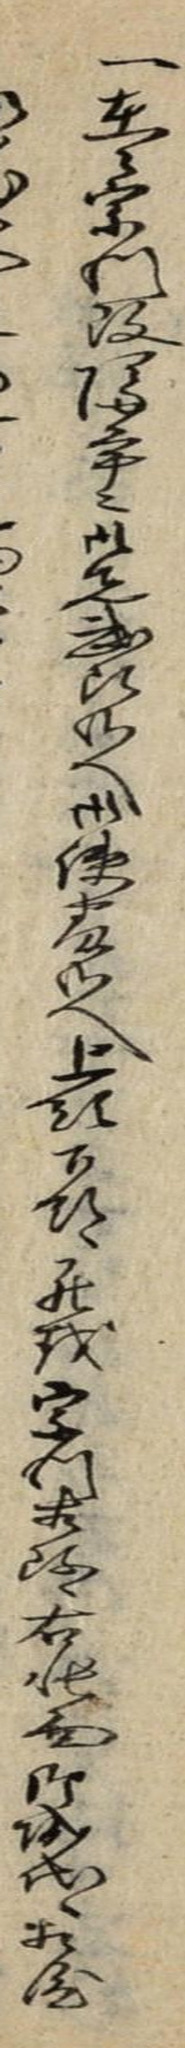一在々宗門改隔年に御先武頭弐人御使番弐人上領下領へ罷越宗門相改候右帳面御城代へ相渡
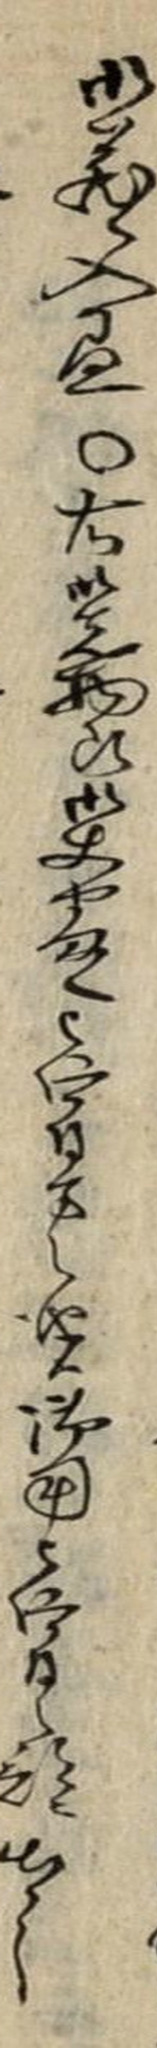御蔵へ入置○右御先物頭御使番へ被仰付方之儀は御用被仰付之部に出之
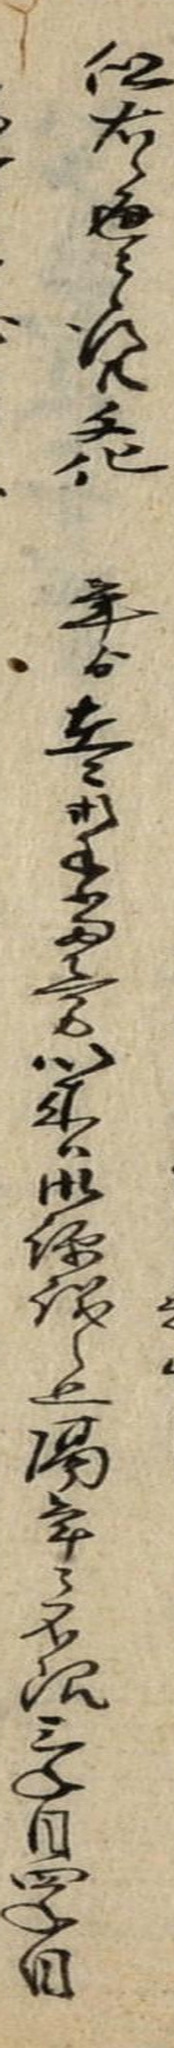但右之通に候得共文化年ゟ在々御手当旁以来は御評議之上隔年に不限三年目四年目
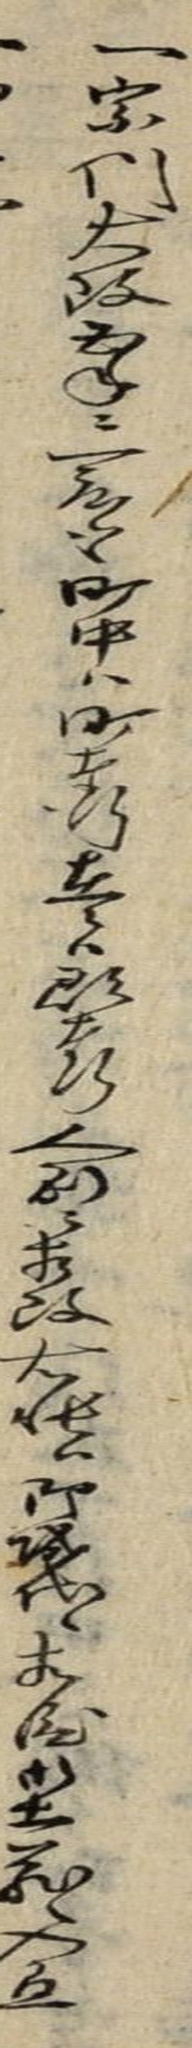一宗門大改五年に一度ツヽ町中は町奉行在々は郡奉行人別に相改右帳は御城代へ相渡御土蔵へ入置
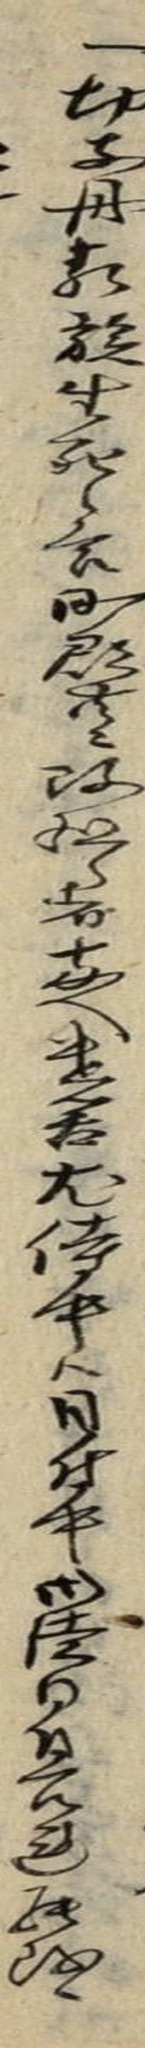一切支丹類族生死之節町郡共に改組之者両人遣筈尤侍中は目付中御徒目付召連罷越候
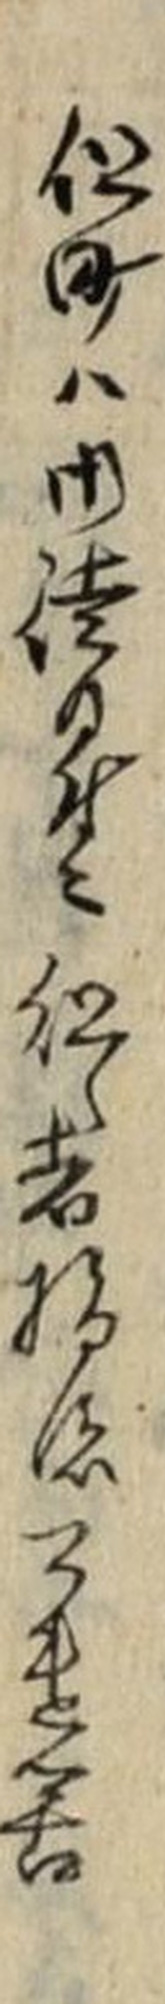但町は御徒目付に組之者指添可遣筈
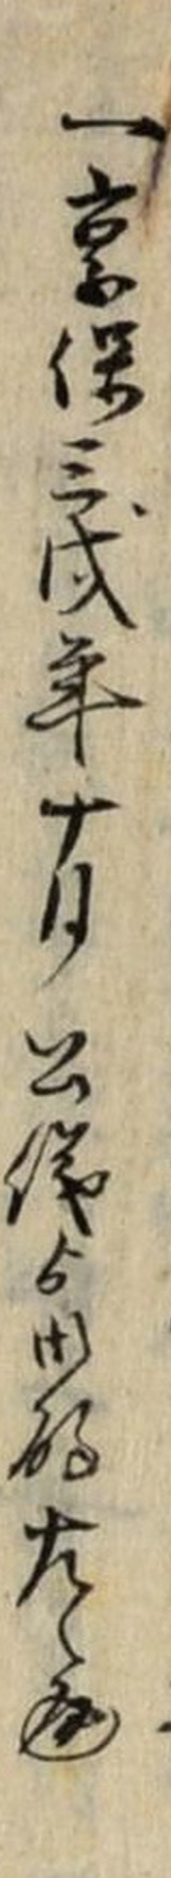一享保三戌年十月公儀ゟ御触左之通
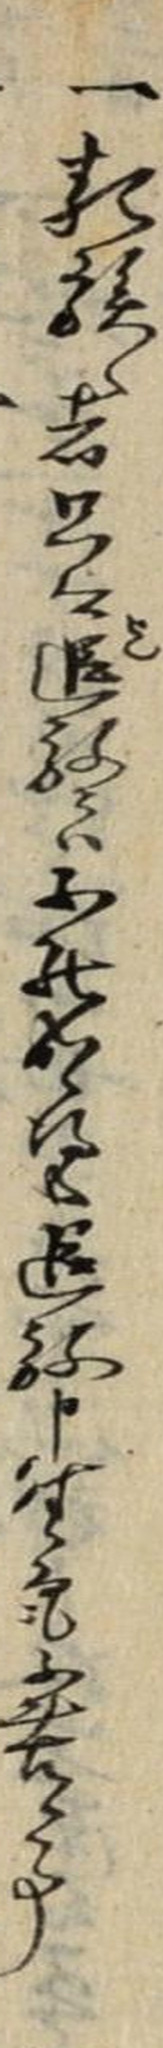一類族之者只今迄追放には不罷成候得共追放申付候ても不苦候事
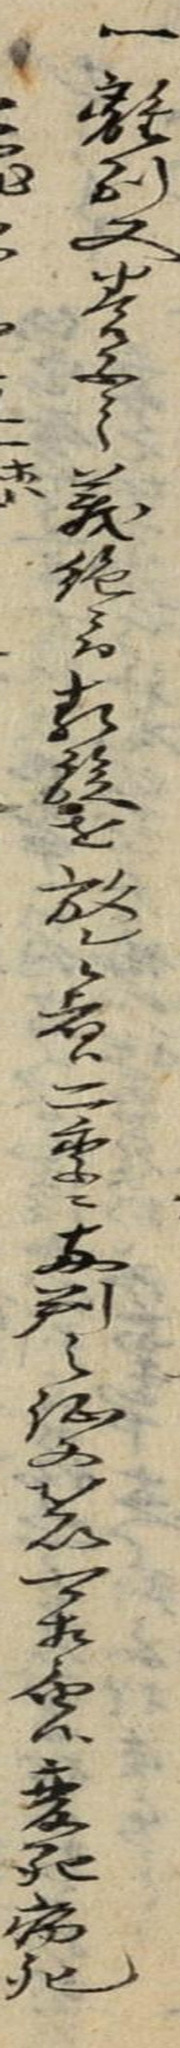一離別又養子之義絶にて類族を放レ候者は二季に両判之証文を以可相届候変死病死
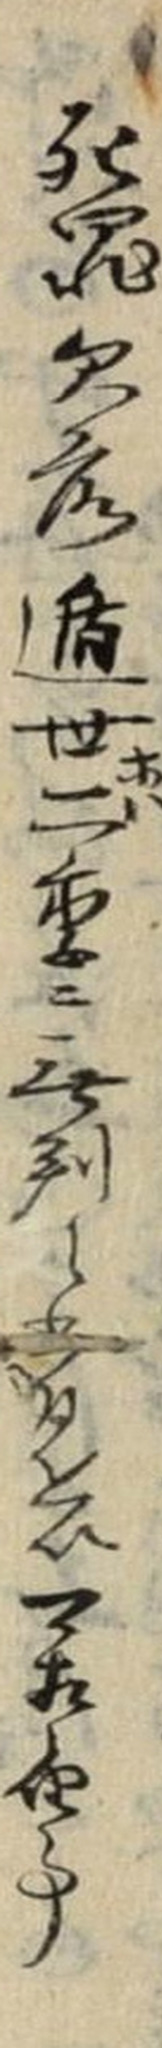死罪欠落遁世等は二季に無判之書付を以可相届事
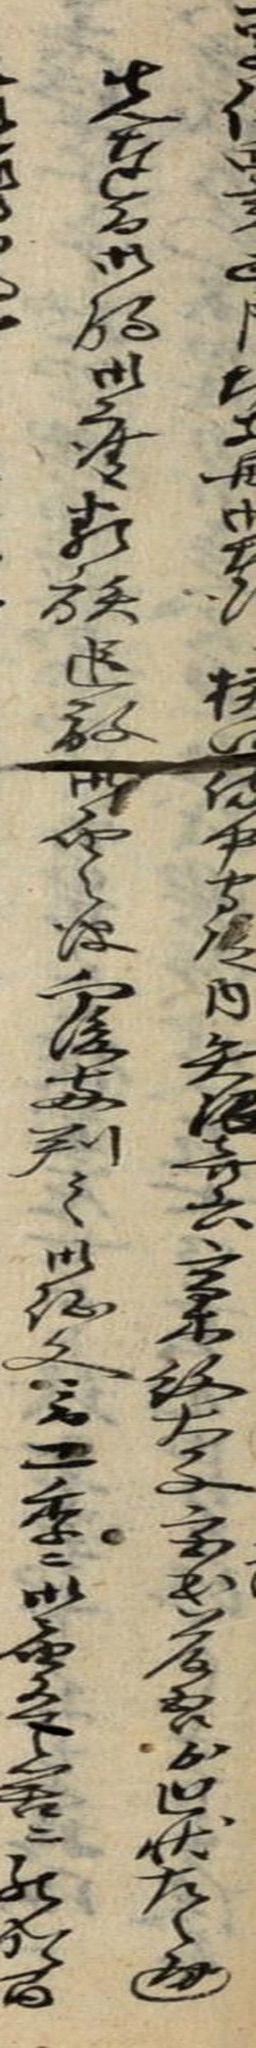先達て御触御座候類族追放御届之儀向後両判之御証文にて二季に御届有之筈に罷成候間
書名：御停止異変死失
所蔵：福井県文書館 Fukui Prefectural Archives
